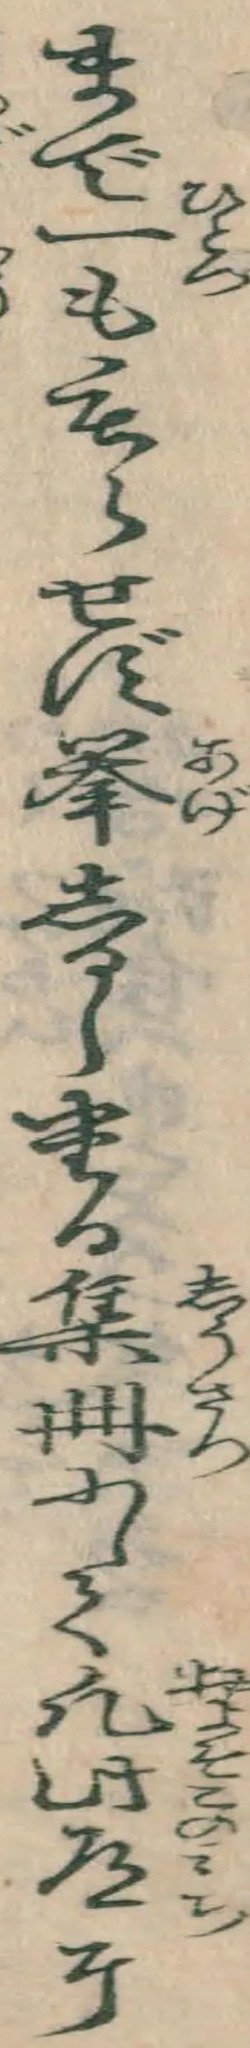まで一ももらせず挙しるしたる集冊にして凡此道に
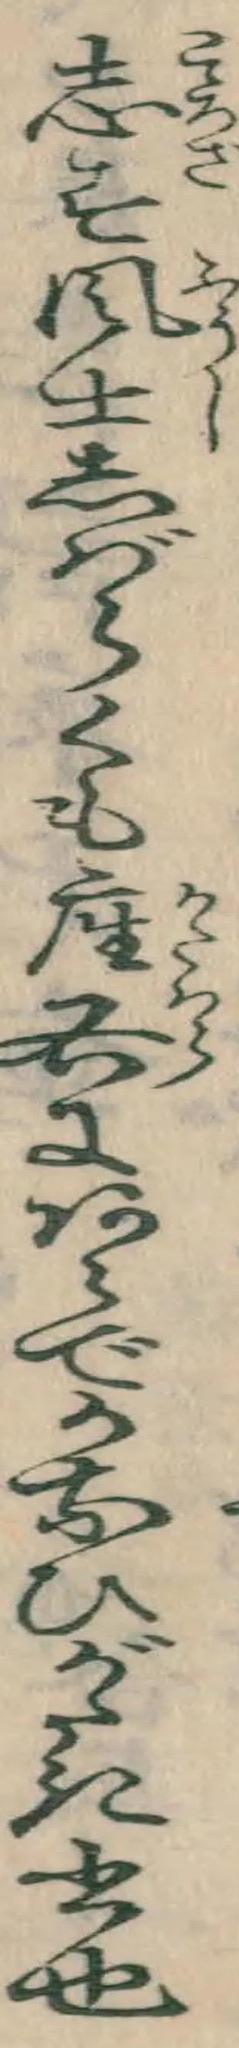志す風士しばらくも座右にあらでかなひがたき書也
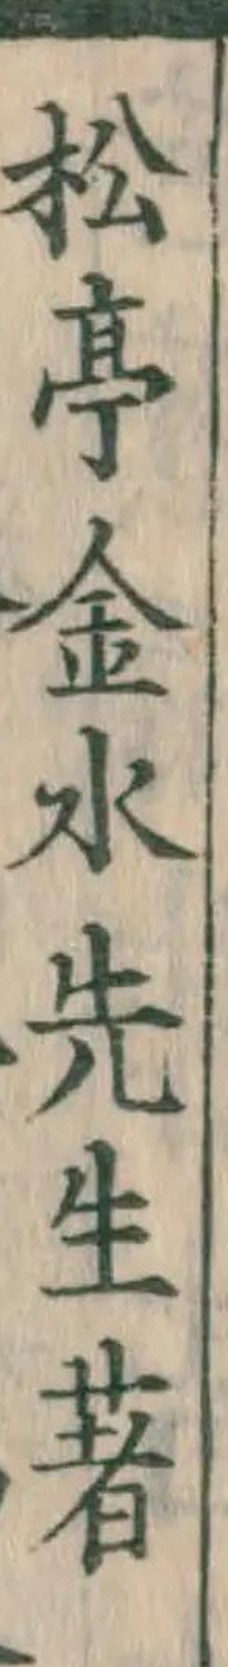松亭金水先生著
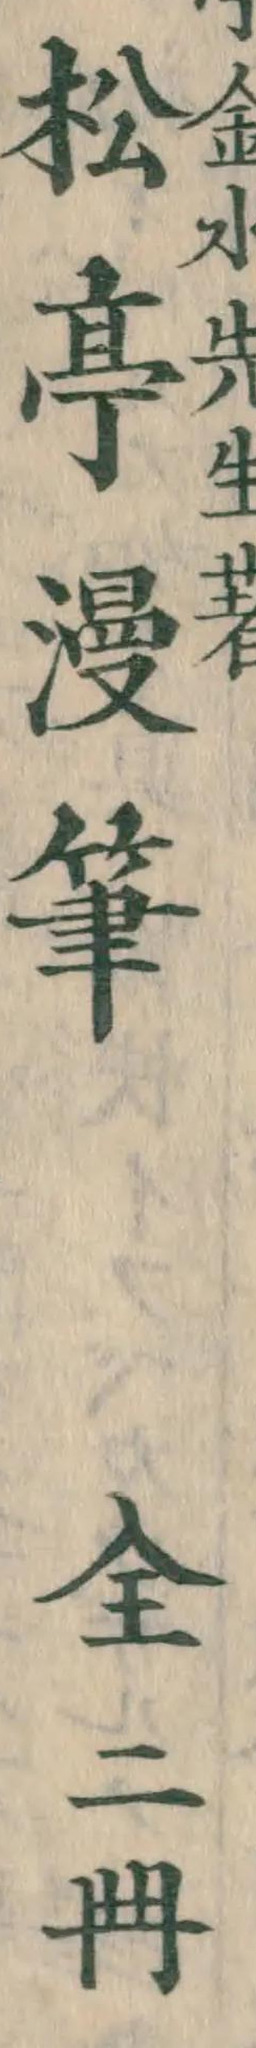松亭漫筆全二冊
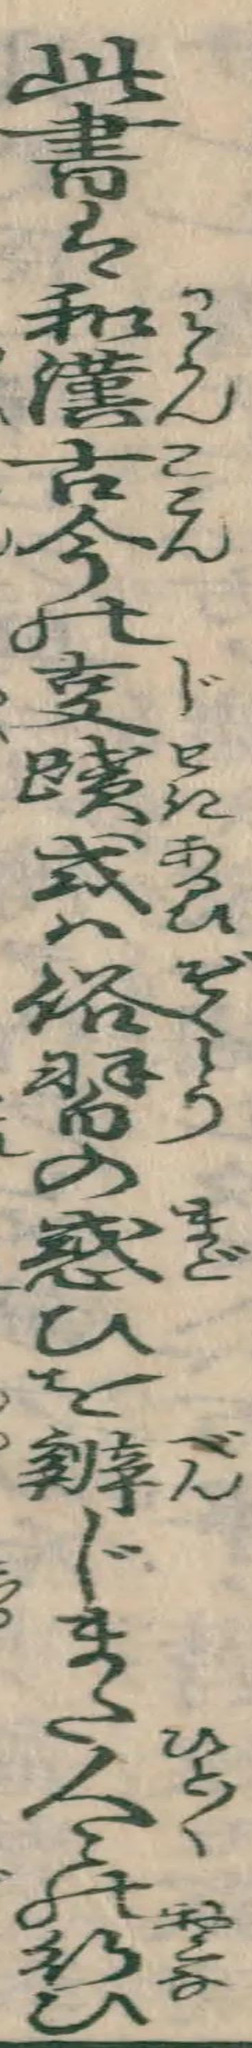此書は和漢古今の事蹟或は俗習の惑ひを弁じまた人々の行ひ
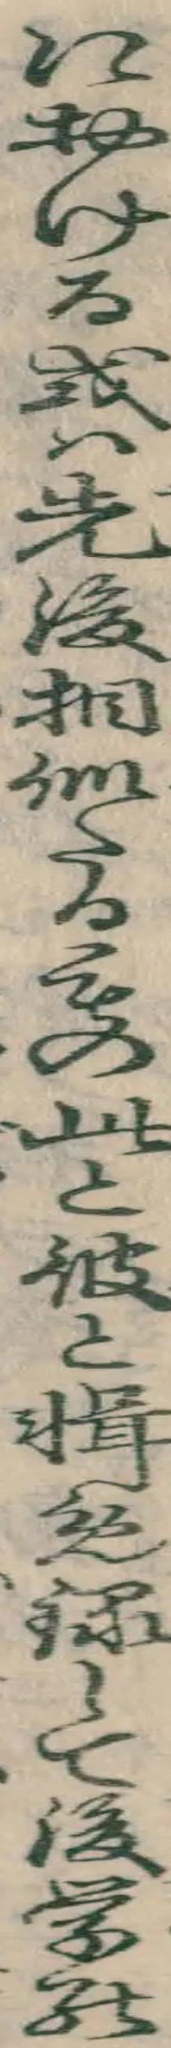における或は先後相似たるもの此と彼と輯め録して後学の
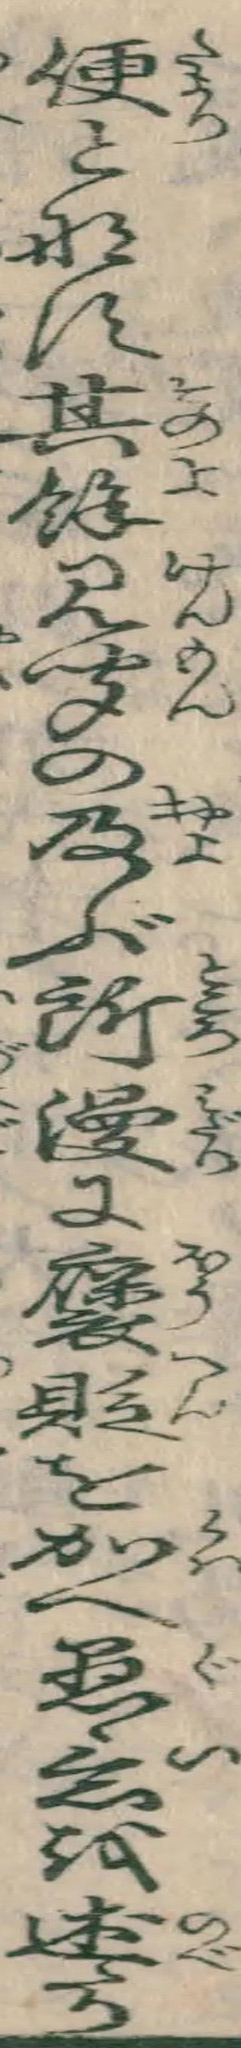便となす其余見聞の及ぶ所漫に褒貶を加へ愚意を述たり
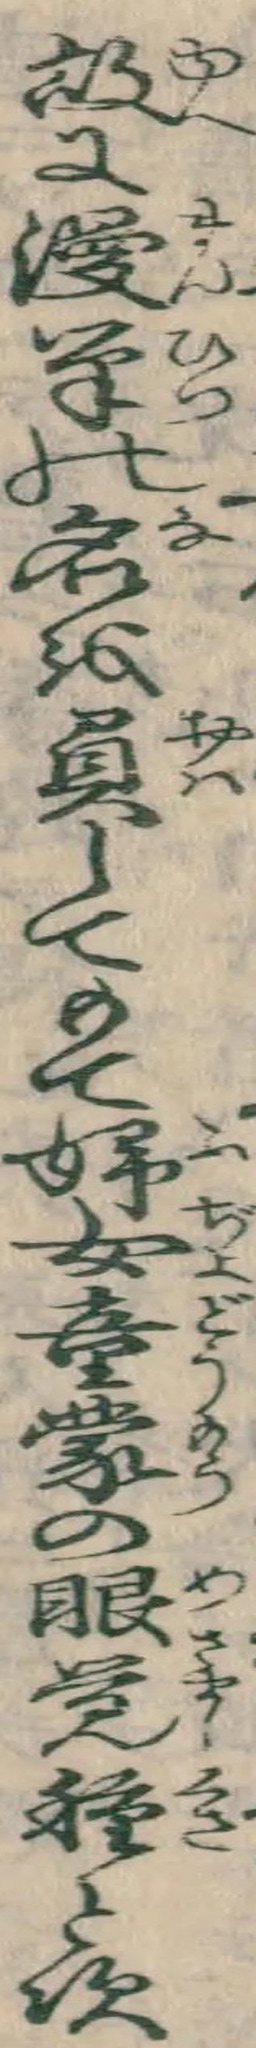故に漫筆の名を負してもて婦女童蒙の眼覚種とす
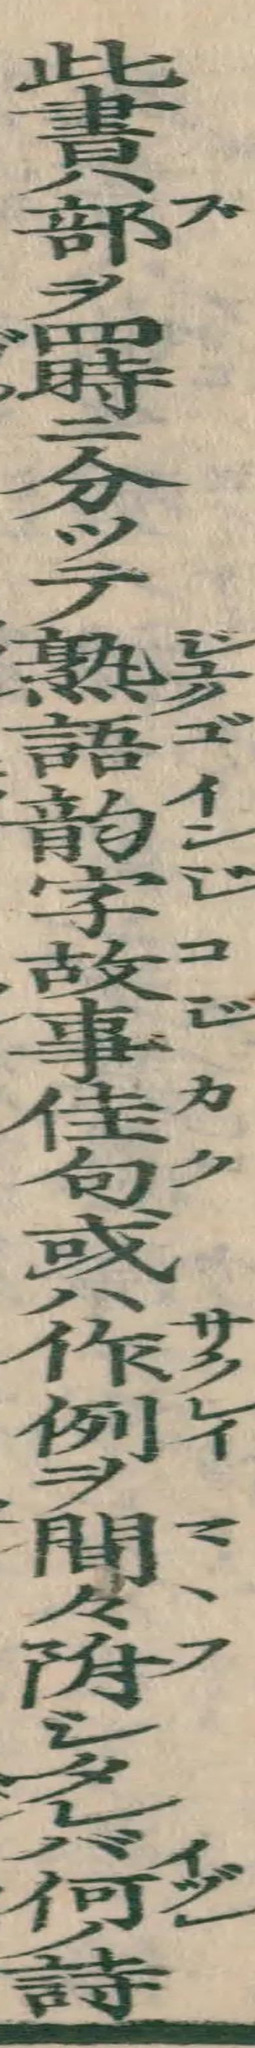此書ハ部ヲ四時ニ分ツテ熟語韵字故事佳句或ハ作例ヲ間々附シタレバ何ノ詩
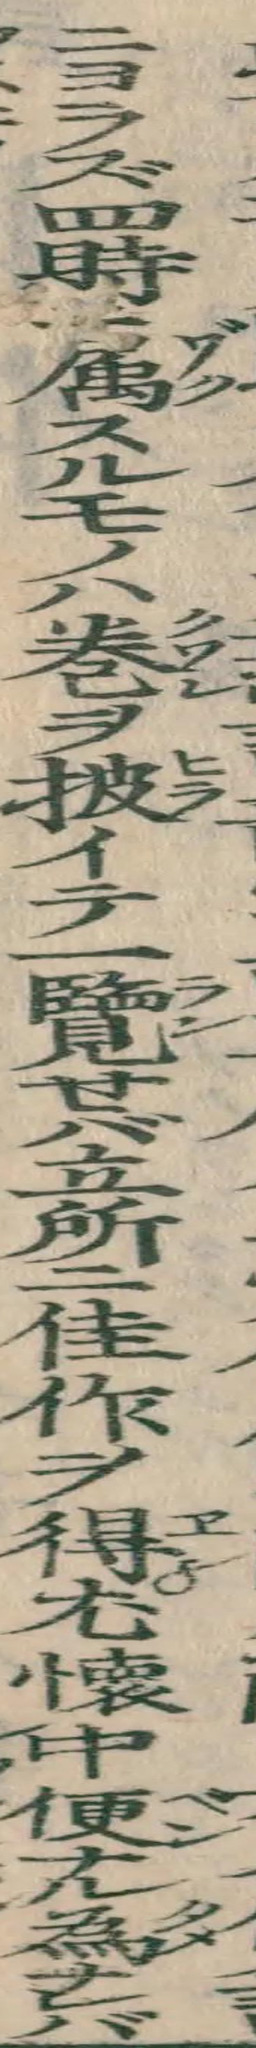ニヨラズ四時一属スルモノハ巻ヲ披イテ一覧セバ立所ニ佳作ヲ得。尤懐中便ナル為ナレバ
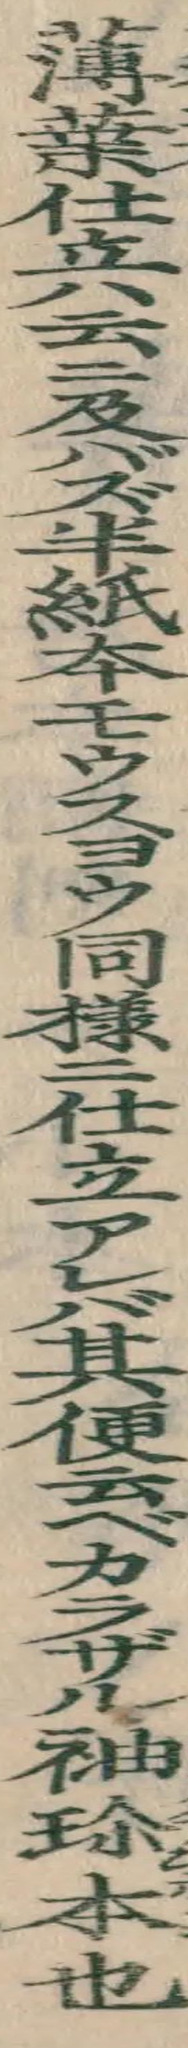薄葉仕立ハ云ニ及バズ半紙本モウスヨウ同様ニ仕立アレバ其便云ベカラザル袖珍本也
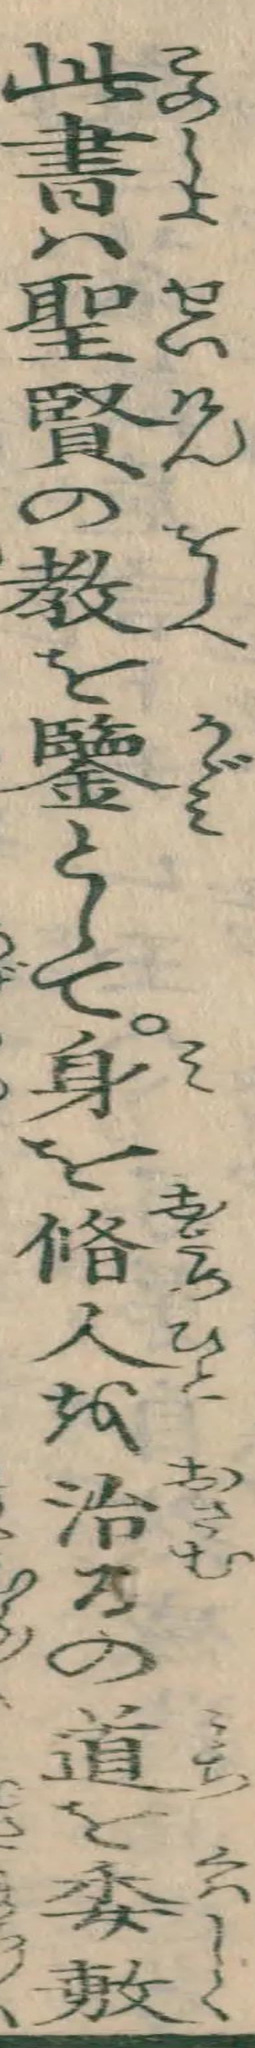此書は聖賢の教を鑑として。身を修人を治るの道を委敷
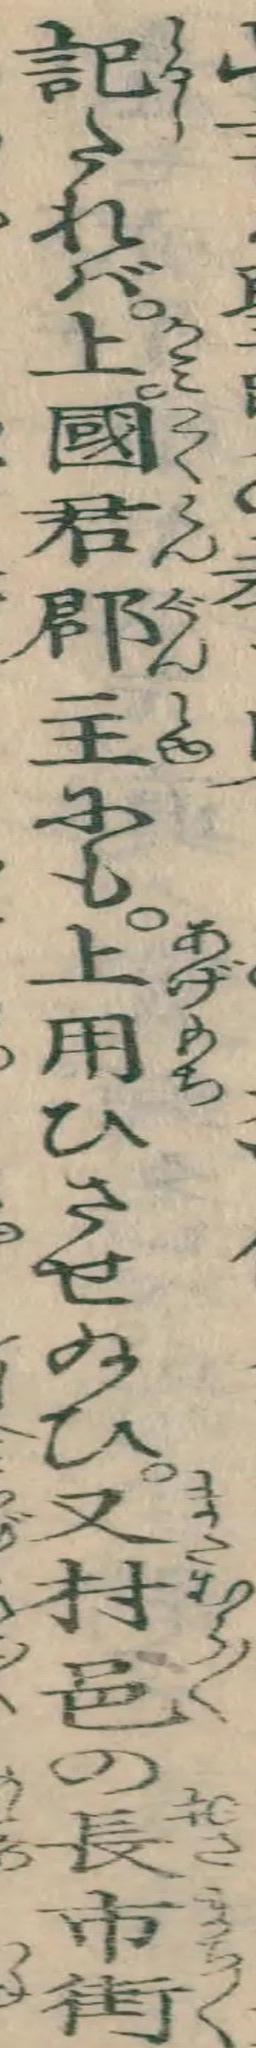記たれば。上。国君郡主にも。上用ひさせ給ひ。又村邑の長市街
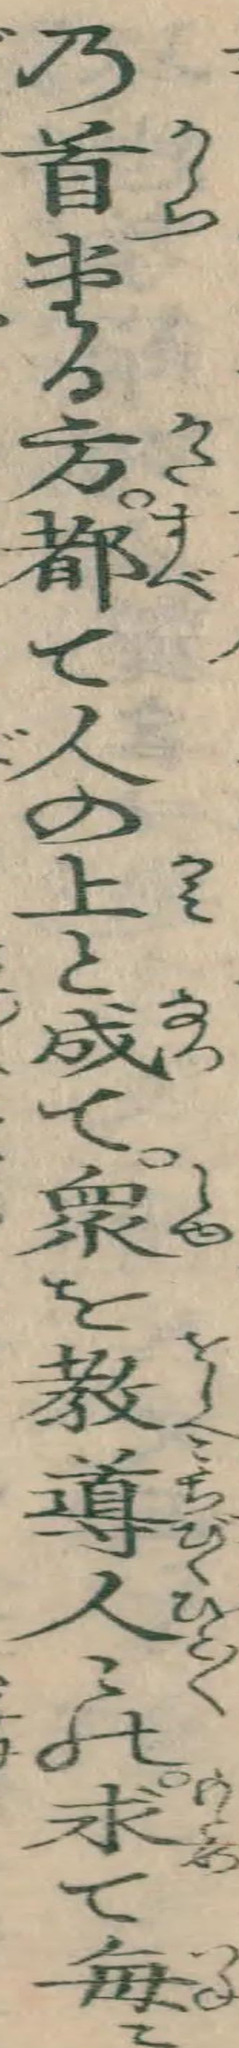の首たる方。都て人の上と成て。衆を教導人々の。求て毎々
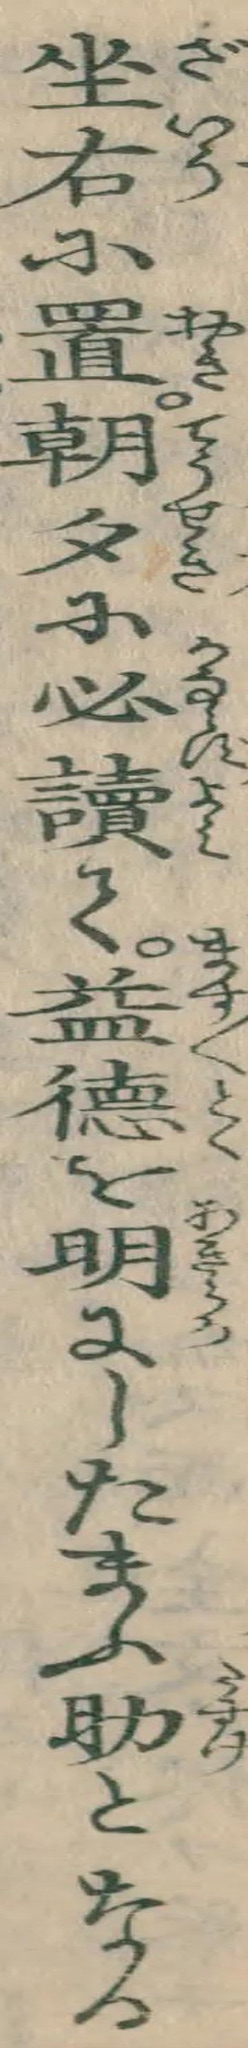坐右に置。朝夕に必読て。益徳を明にしたまふ助となる
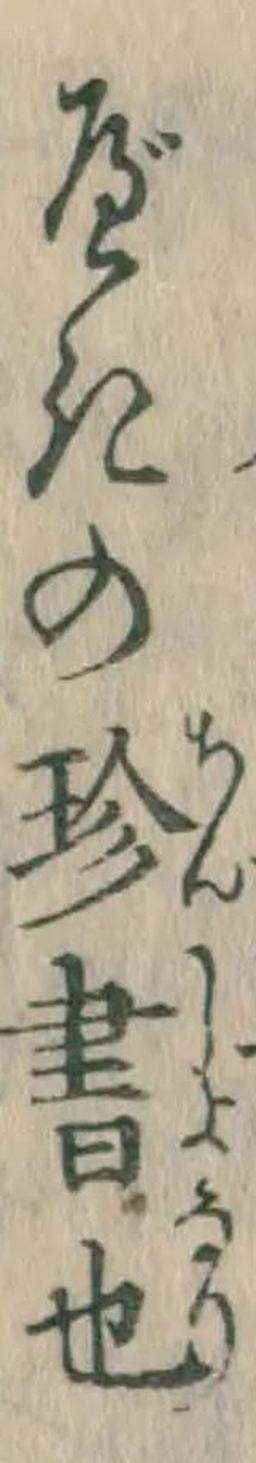べきの珍書也
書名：これこれ草 2巻. [2]
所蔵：国立国会図書館 National Diet Library, JAPAN
